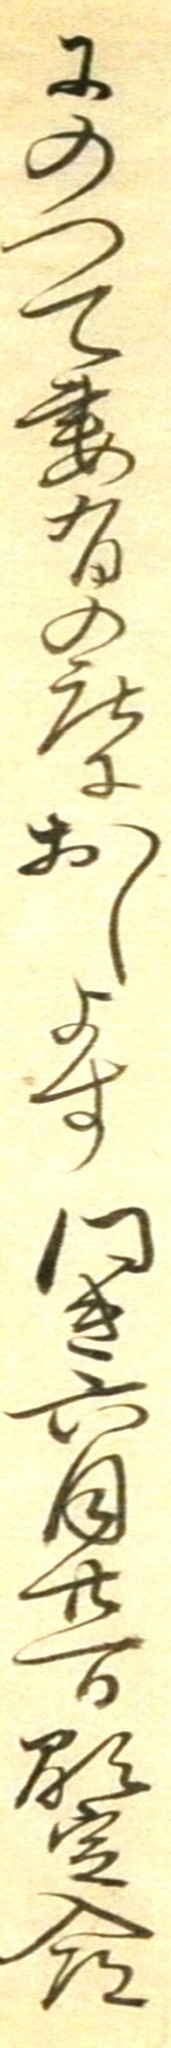にのつて妻有の庄におしよす同き六月廿一日顕定入道
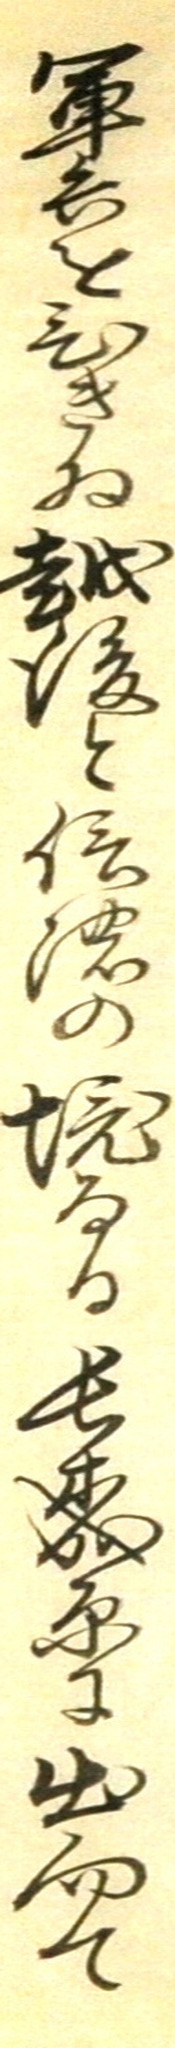軍兵をひきゐ越後と信濃の境なる長森原に出向て

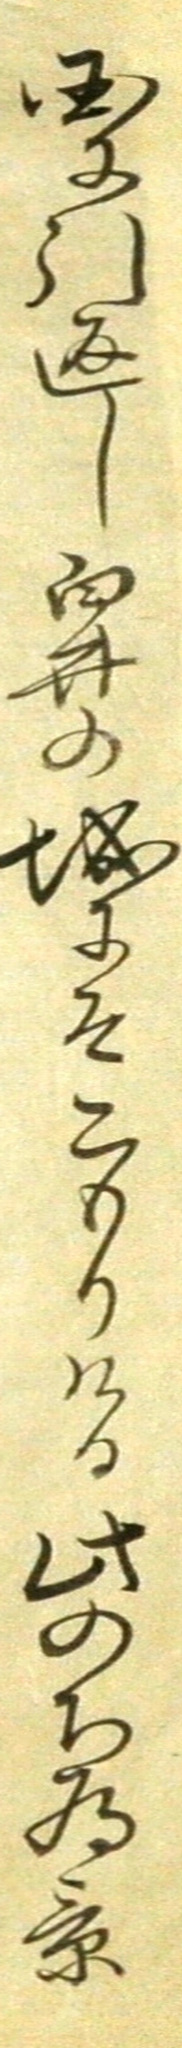国に引返し白井の城にそこもりける此のち為景
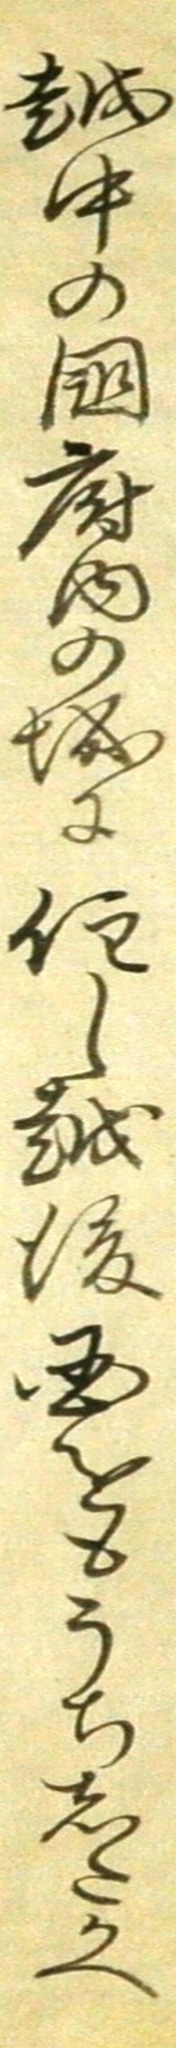越中の国府内の城に住し越後国をもうちしたかへ
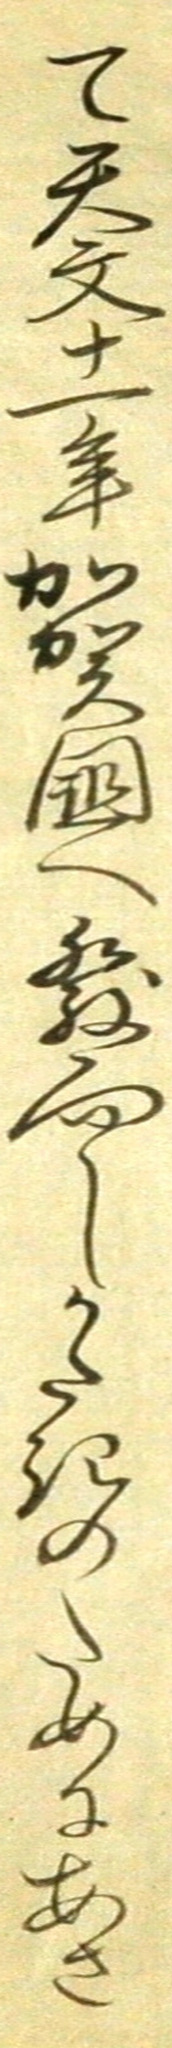て天文十一年加賀国へ発向しかたきのためにあさ
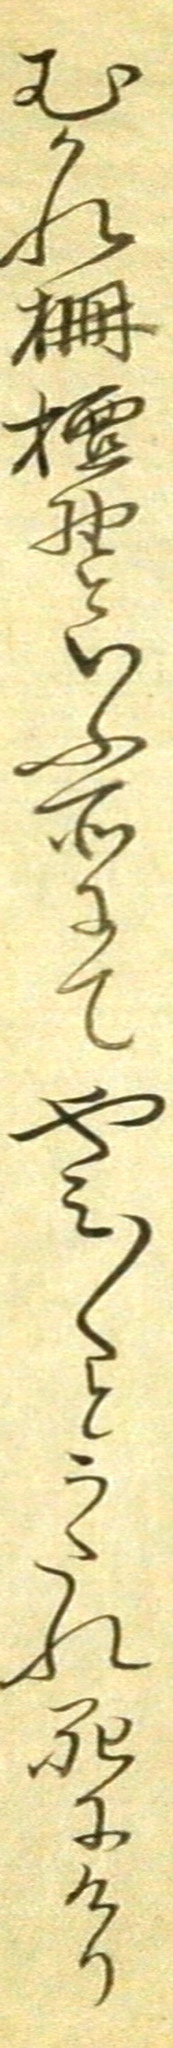むかれ棚檀野といふ所にてやみ〳〵とうたれ死にけり
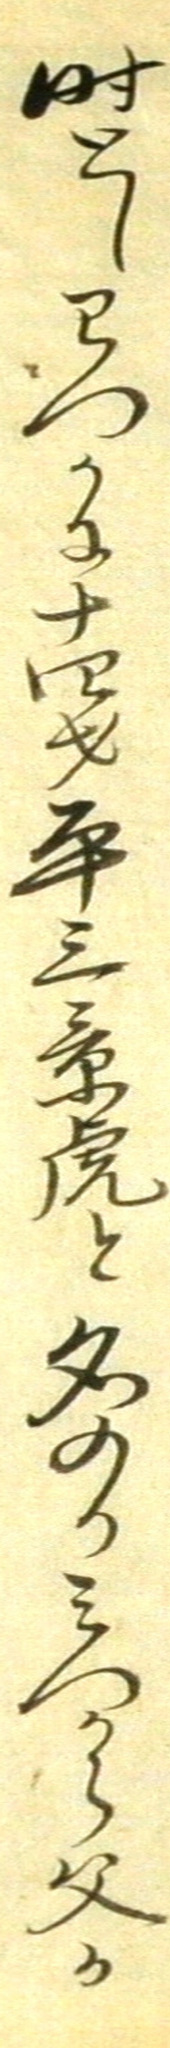時としわつかに十四才平三景虎と名のりみつから父か
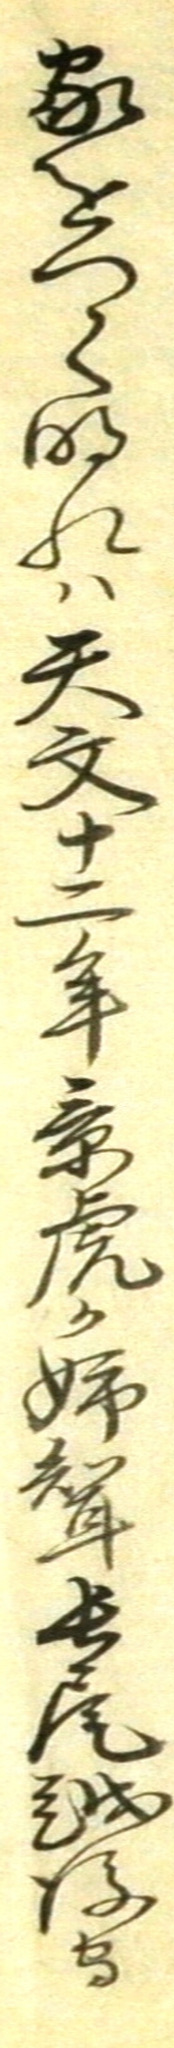家をつく明れは天文十二年景虎か姉聟長尾越後守
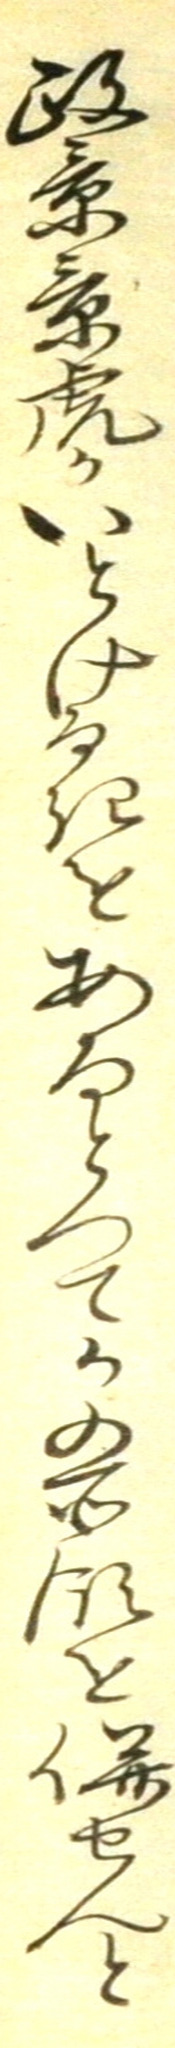政景景虎かいとけなきをあなとつてかの所領を併せんと
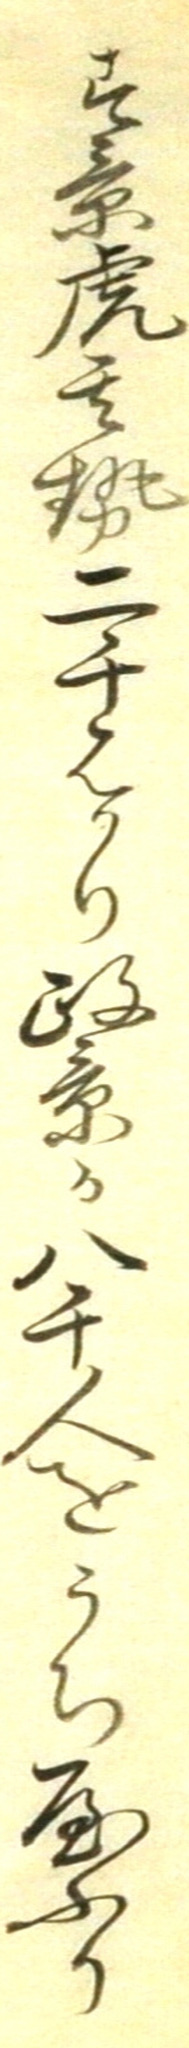す景虎其勢二千はかり政景か八千人をうちやふり
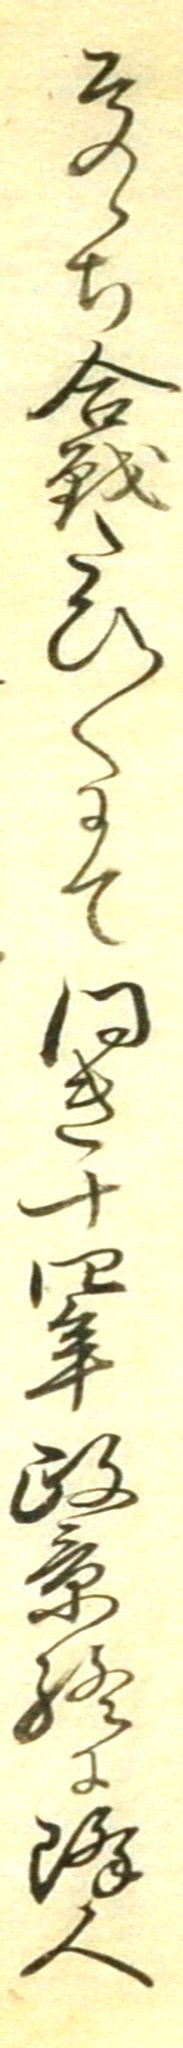そのゝち合戦たひ〳〵にて同き十四年政景終に降人
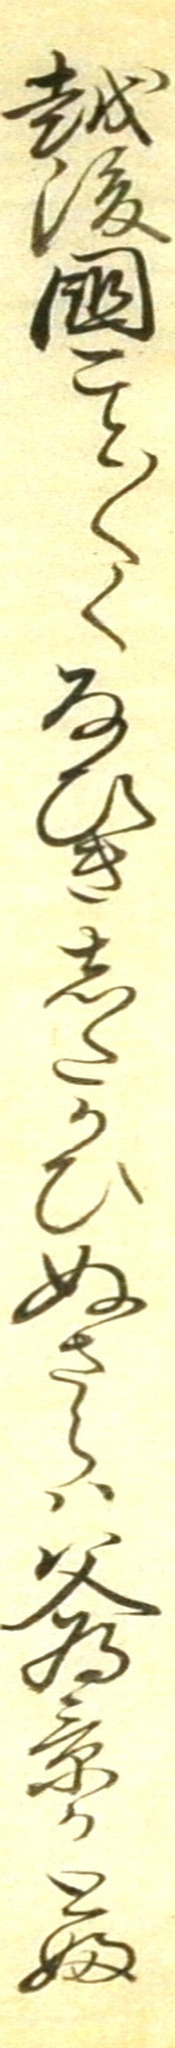越後国こと〳〵くなひきしたかひぬさらは父為景かとふ
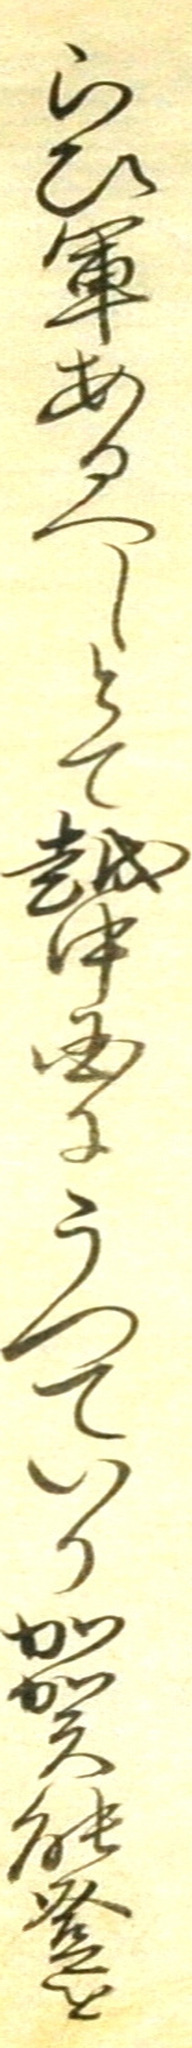らひ軍あるへしとて越中国にうつていり加賀能登を
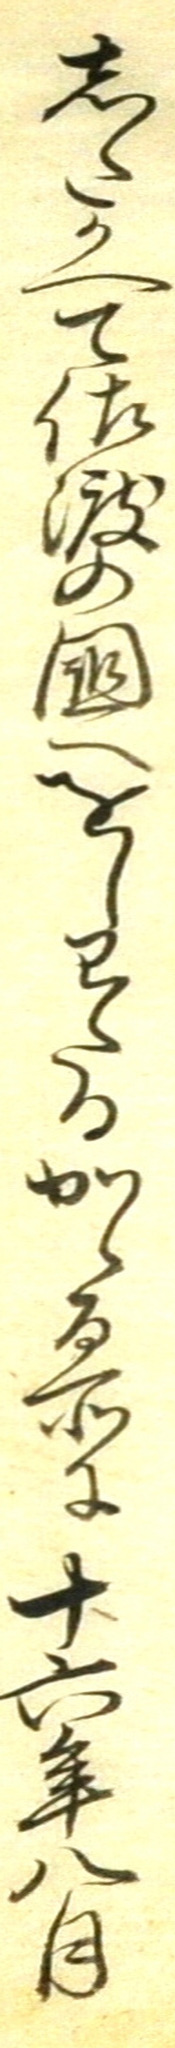したかへて佐渡の国へをしわたるかゝる所に十六年八月
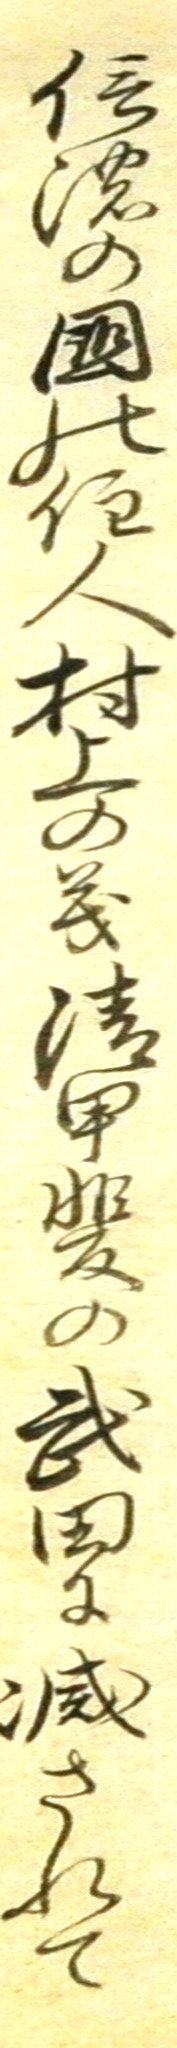信濃の国の住人村上の義清甲斐の武田に滅されて
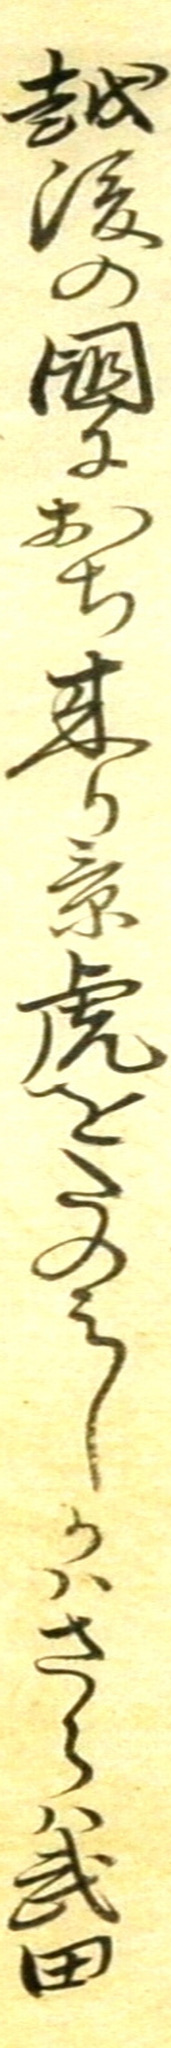越後の国におち来り景虎をたのみしかはさらは武田
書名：藩翰譜（八・下）
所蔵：伊那市立高遠町図書館・合同会社AMANE
